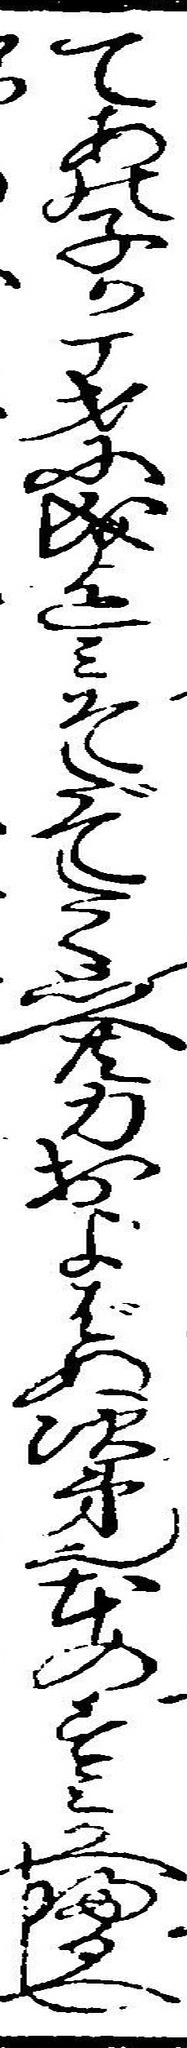てあの子か十才に成迄みそだてたく思へ共力およばぬ次第也本のすみかへ帰るへし
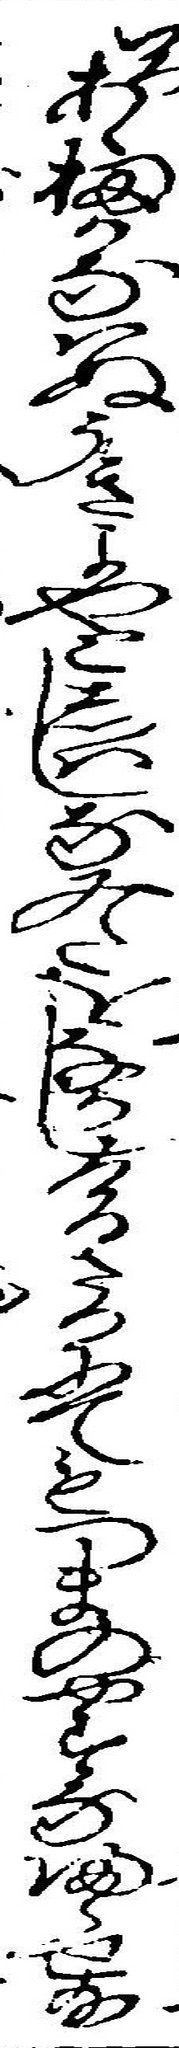いろあゝ扨かなはぬうきよやとしはしなみたをなかしけるさるにてもつまのやすな帰らせ給
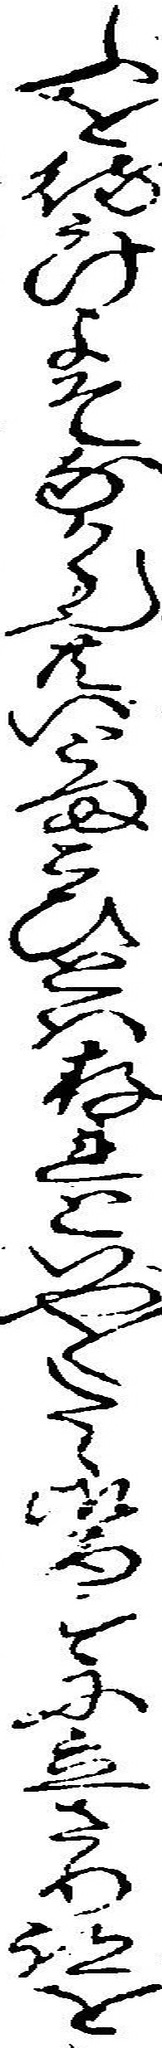ふを待うけよそなから也共いとまこひとは存れといや〳〵たゝ御るすに立さり跡を
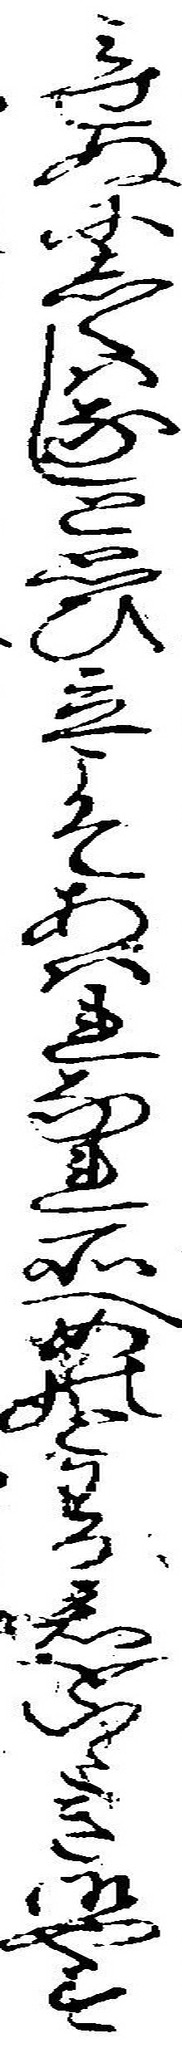みせぬにしくはなしと思ひ立こそあはれなれ所へめのとわか君をいたき御やす
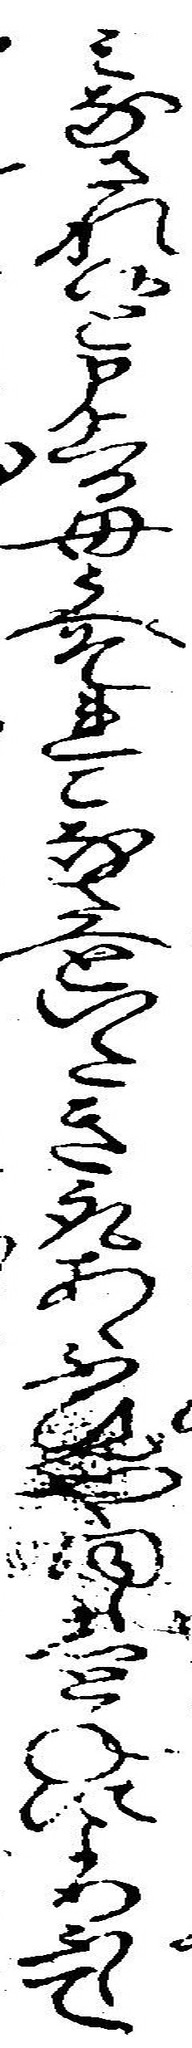みなされ候と申上る母うへそれこなたへといたき取あゝふひんや同ししとねによりふして
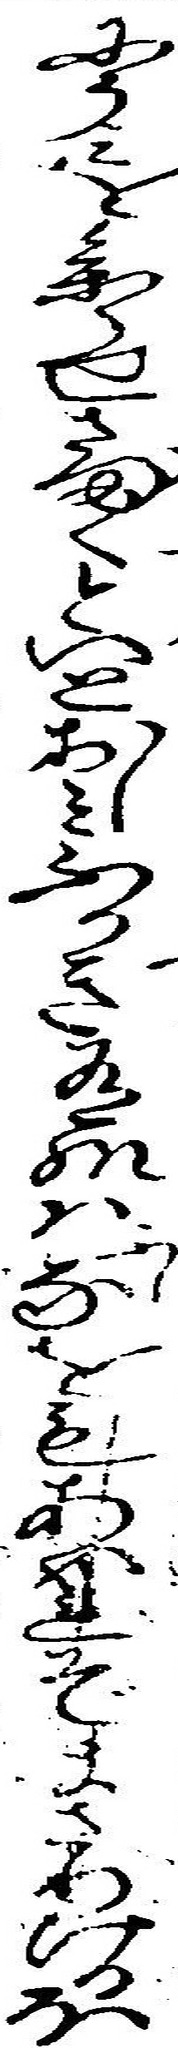にうみを参らせさま〳〵といとおしみふかき有様はふしなをもあはれぞまさりけるほ
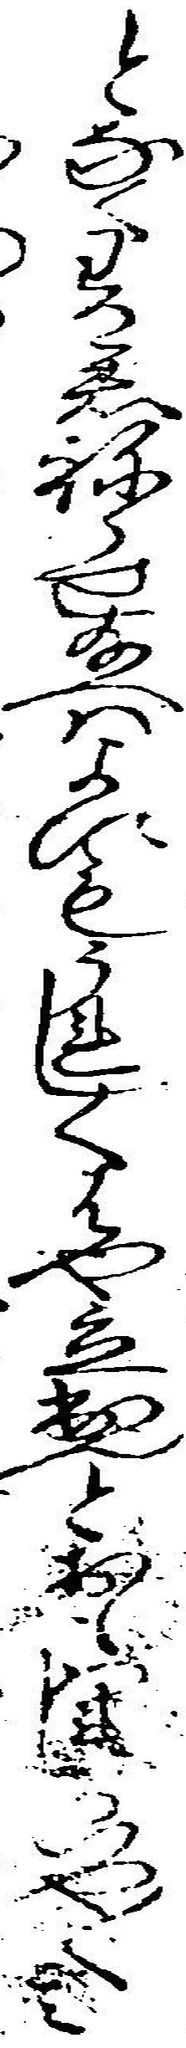となくわか君ねらせ給へはよにもうれしくはや立出んとおもはれしかいや〳〵其
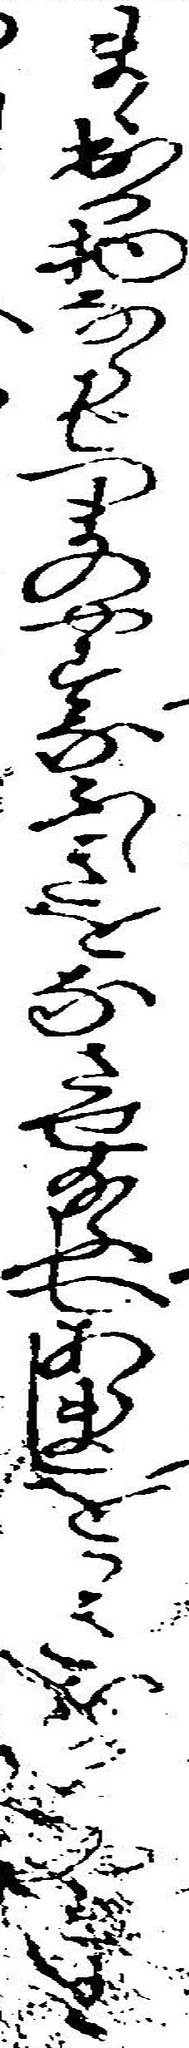まゝ出る物ならばつまのやすなふしきをなさせ給ふへしあらましをきすゝ
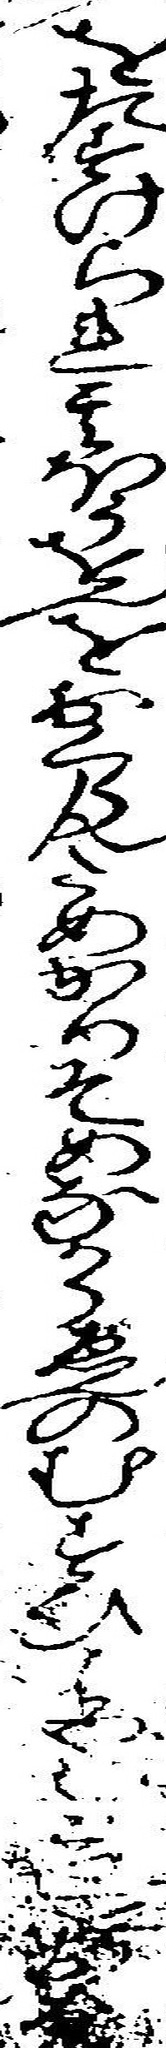をたすけられ其ほうをんをおくらんためかりそめなからゑんのむすひはやむとせ
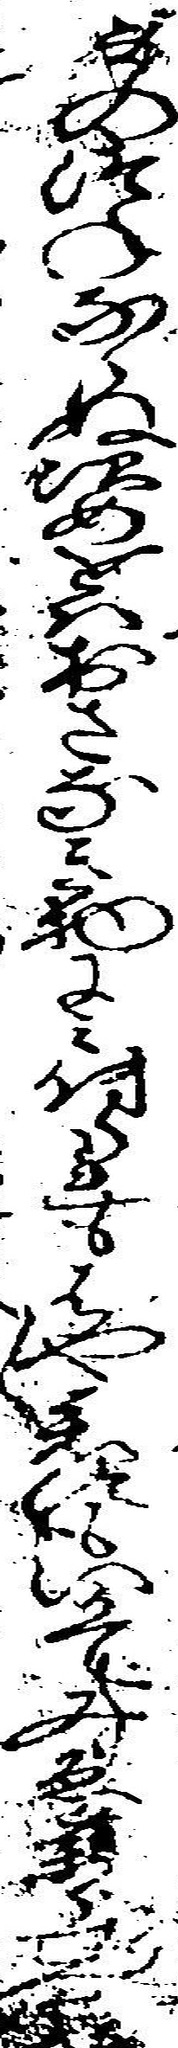身のつねならぬ姿をはおさなき物にみ付られもはや君にもいかてみゑ参らせん
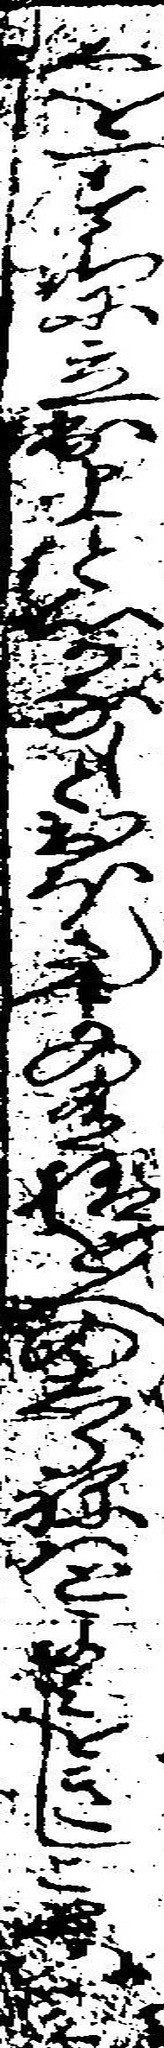心を一すちに立出申と心かなしとおほさんよの有様を人のしらねはとよみをきしとのに

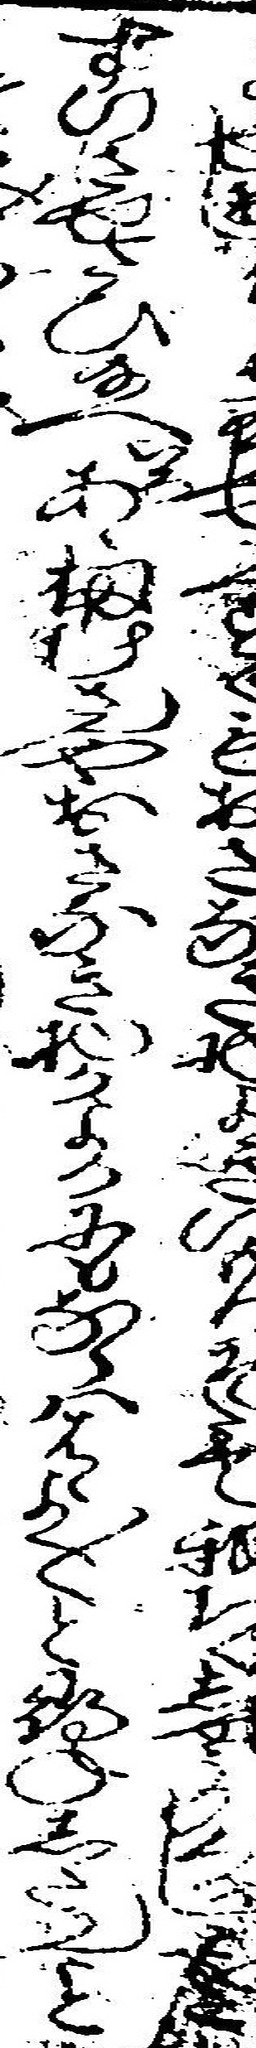すけさせたひ給へいろあゝ扨むさんやおさなき物かよるにもならははゝよ〳〵〳〵と尋ねしたはんこと
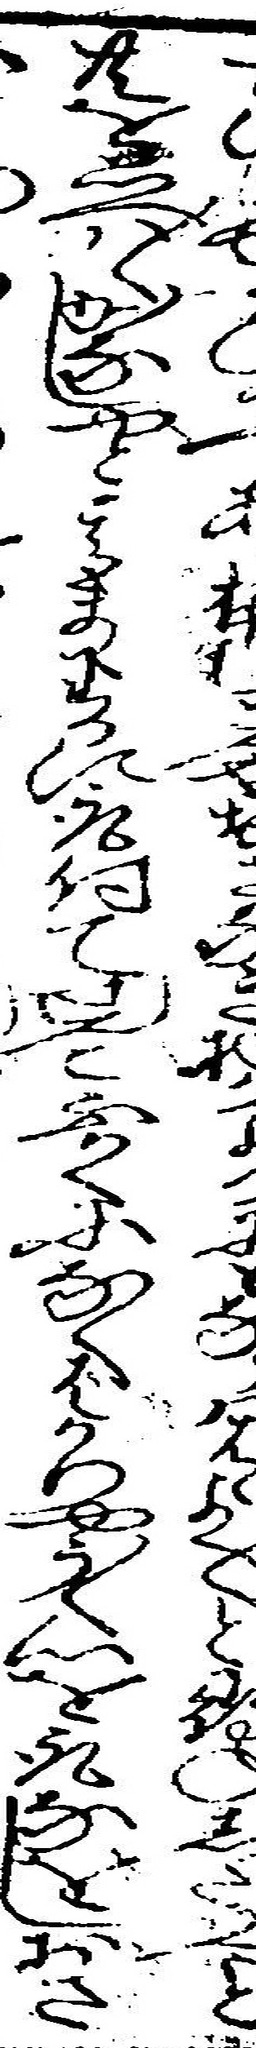共を思へは〳〵かなしやと其まゝわかに取付てせんこふかくになくばかりやう〳〵心を取なをしおさ
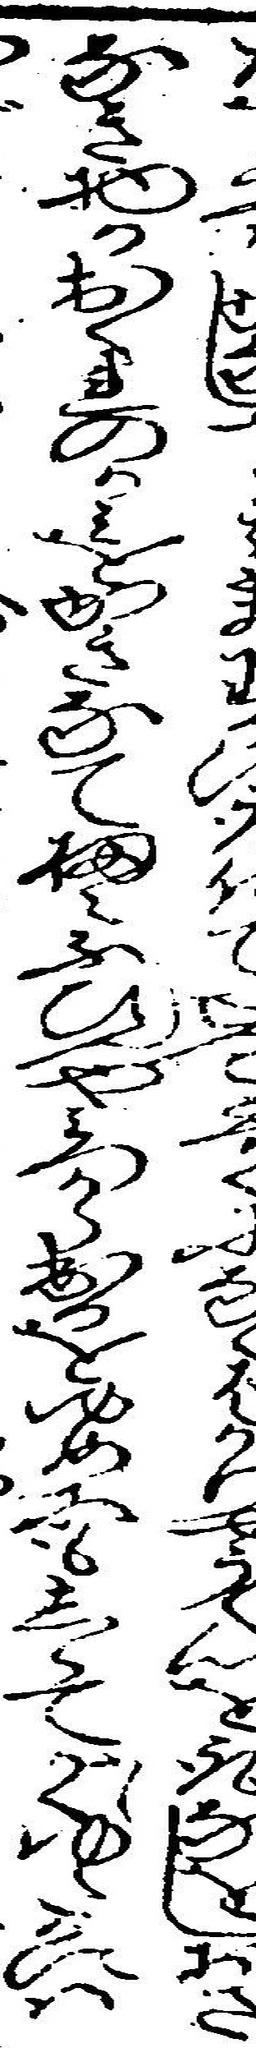なき物かおくれのかみをかきなて扨々ふひんやみつから出るをゆめへもしらてふしかくゆたかには
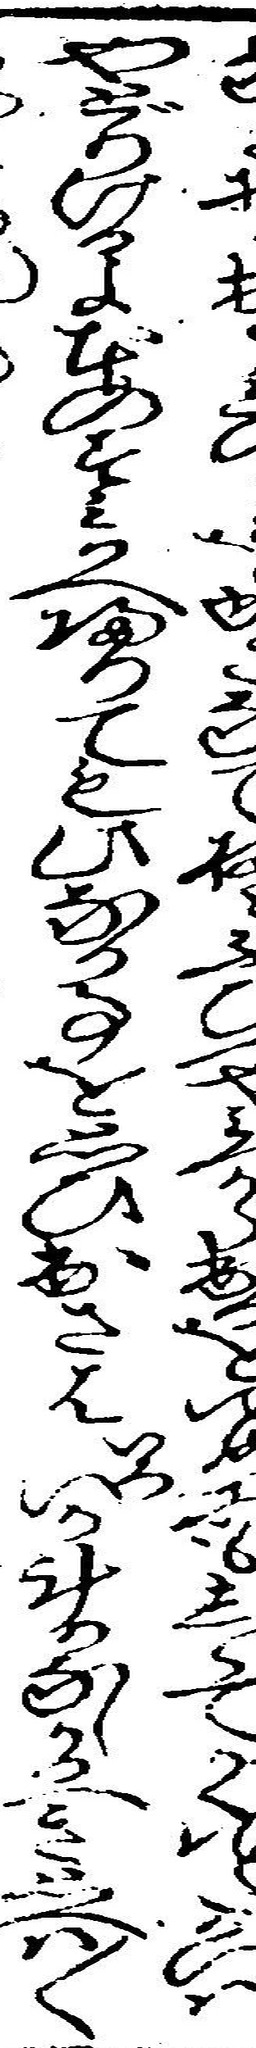やどりけるよ本のすみかへ帰りても此なり事を思ひ出さはいろいか斗かなしかるへき思へは〳〵
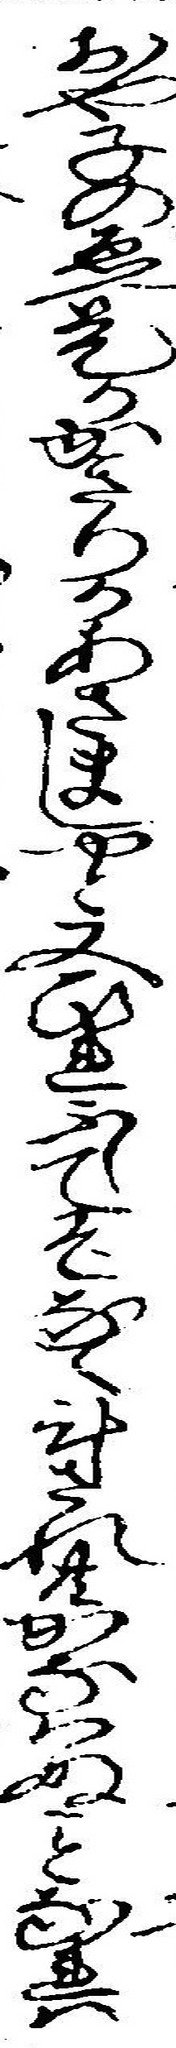おや子のゑん是かかきりかあさましやと又ひれふしてぞなく斗され共かなはぬとなれは
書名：[しのだづまつりぎつね付あべの清明出生]
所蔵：東京大学総合図書館 General Library in the University of Tokyo, JAPAN
